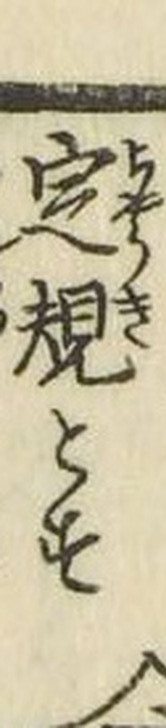定規とす
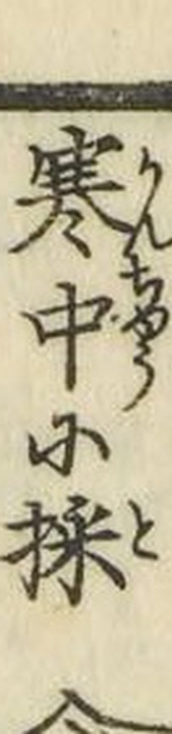寒中に採
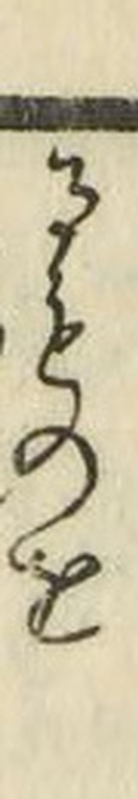るものを
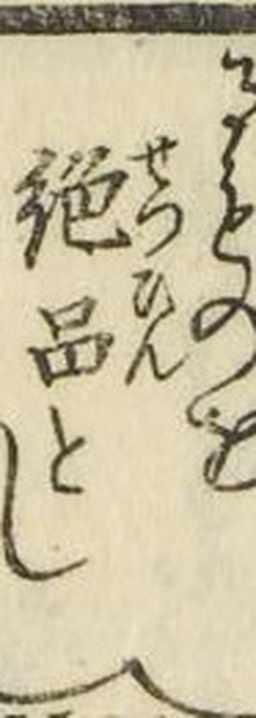絶品とし
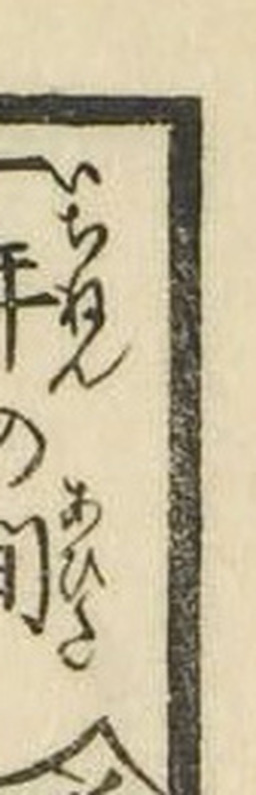一年の間
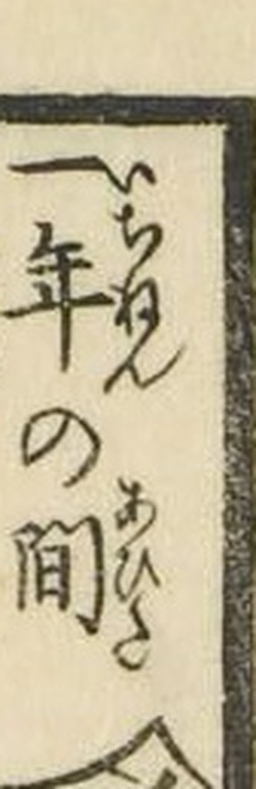一年の間
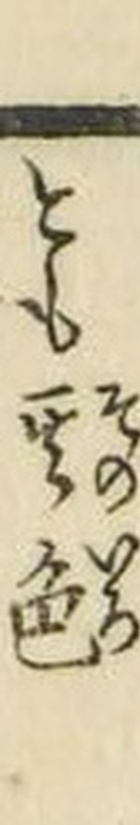とも其色
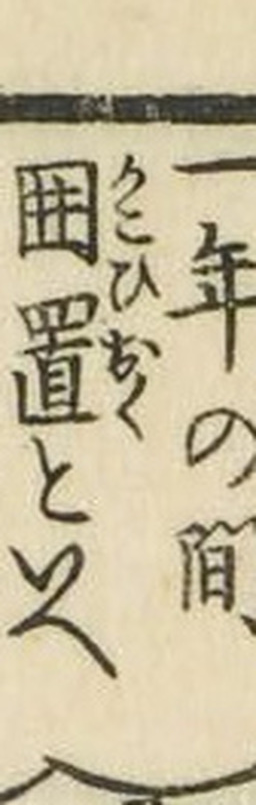囲置といへ
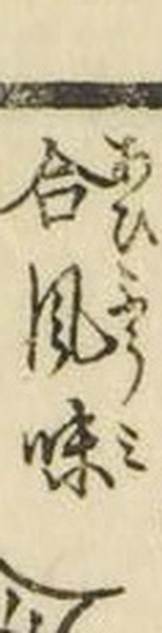合風味
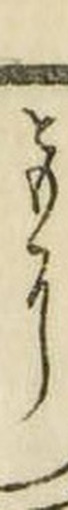ともに
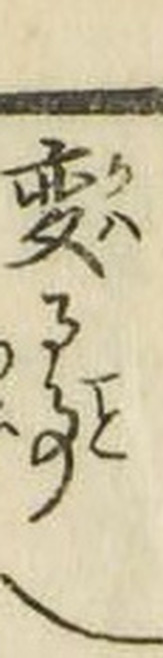変る事
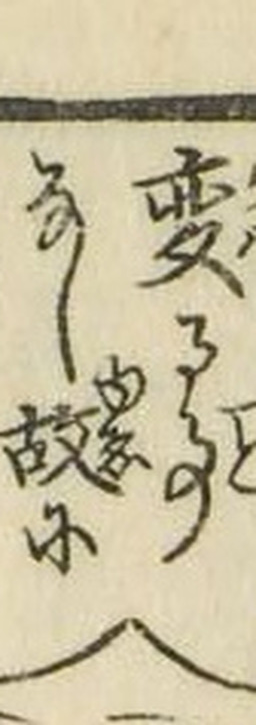なし故に
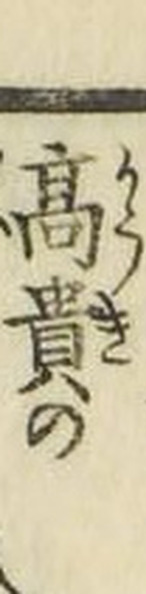髙貴の
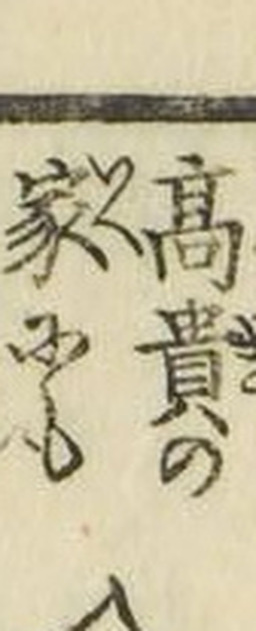家にも
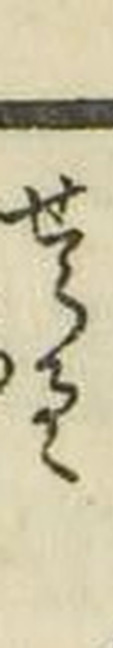せらるゝ
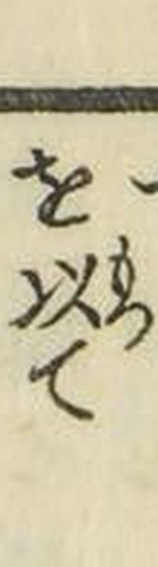を以て
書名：江戸名所図会 20巻 巻之4
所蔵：東京学芸大学教育コンテンツアーカイブ
